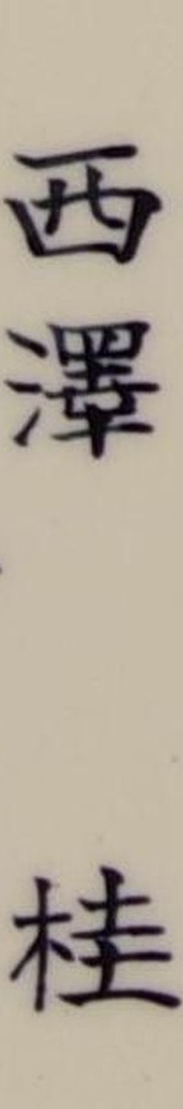西澤桂
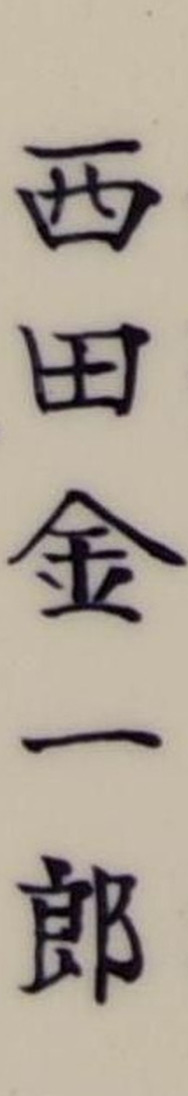西田金一郎
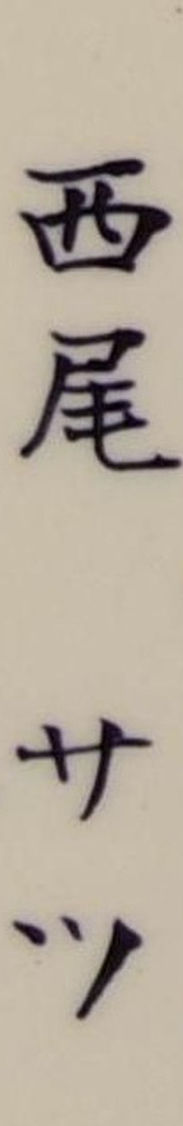西尾サツ
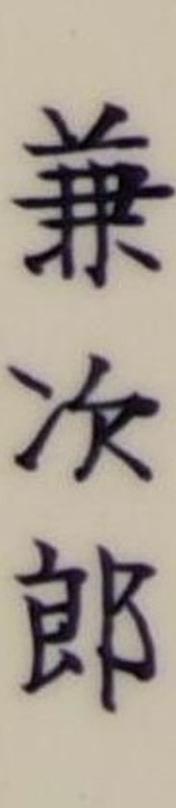兼次郎

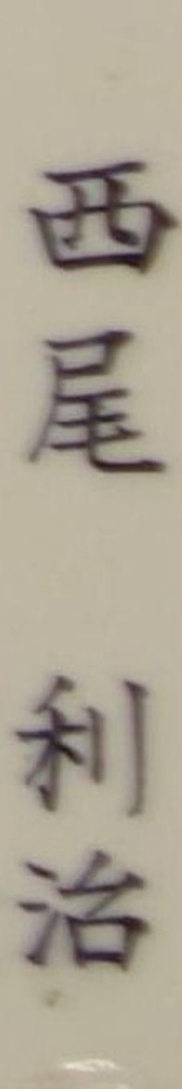西尾利治
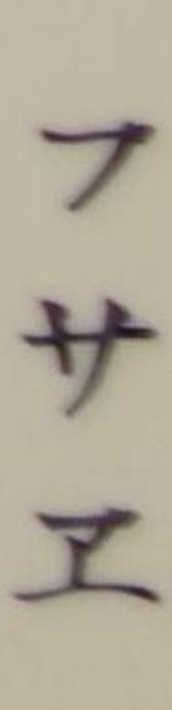フサエ
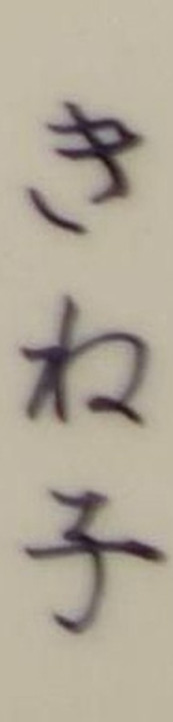きね子
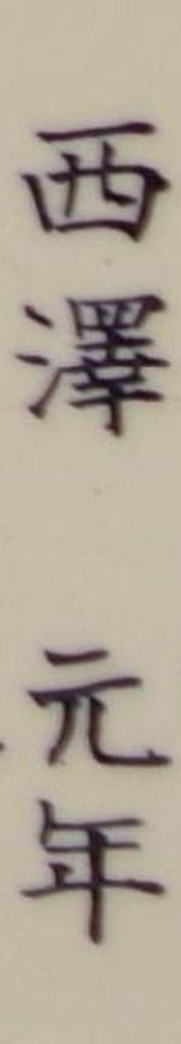西澤元年
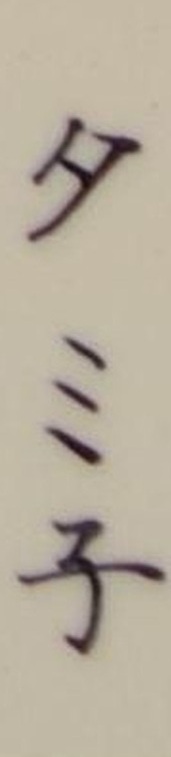タミ子
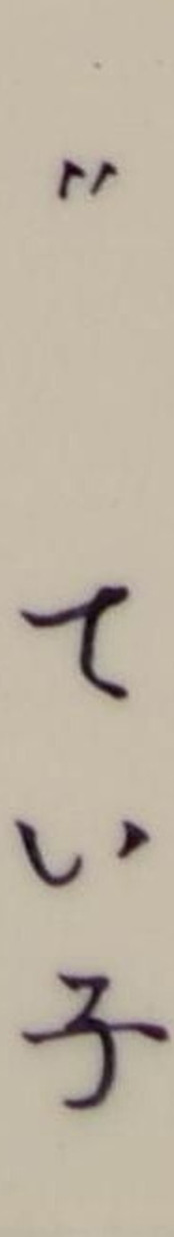てい子
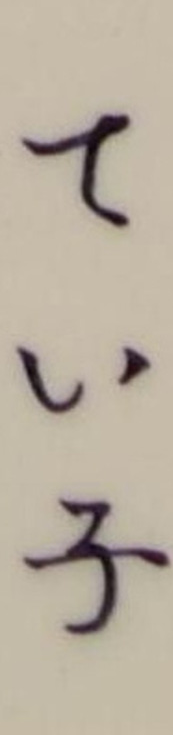てい子
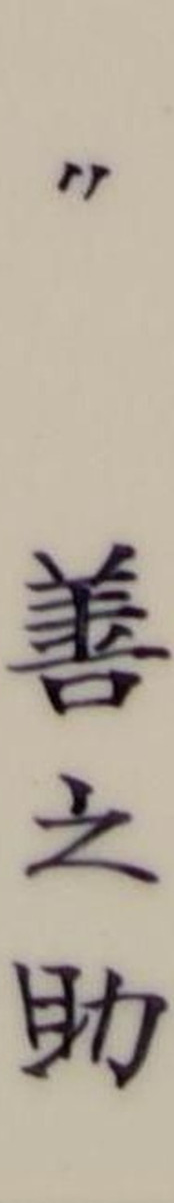善之助
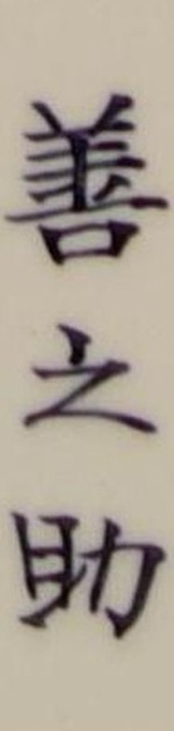善之助
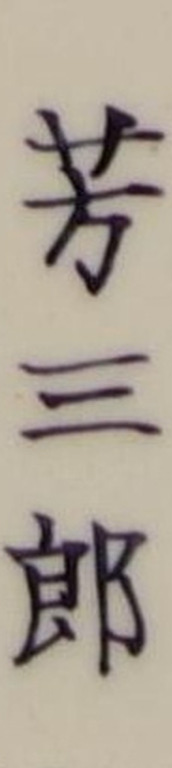芳三郎
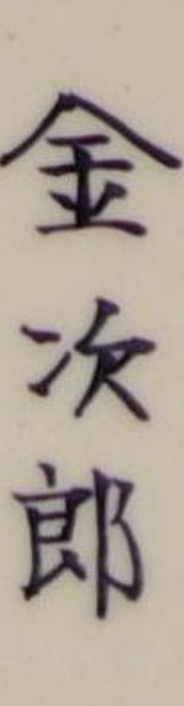金次郎
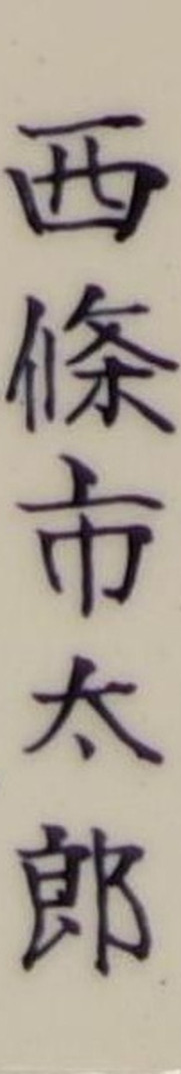西條市太郎
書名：M~S
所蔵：高野山金剛峯寺
